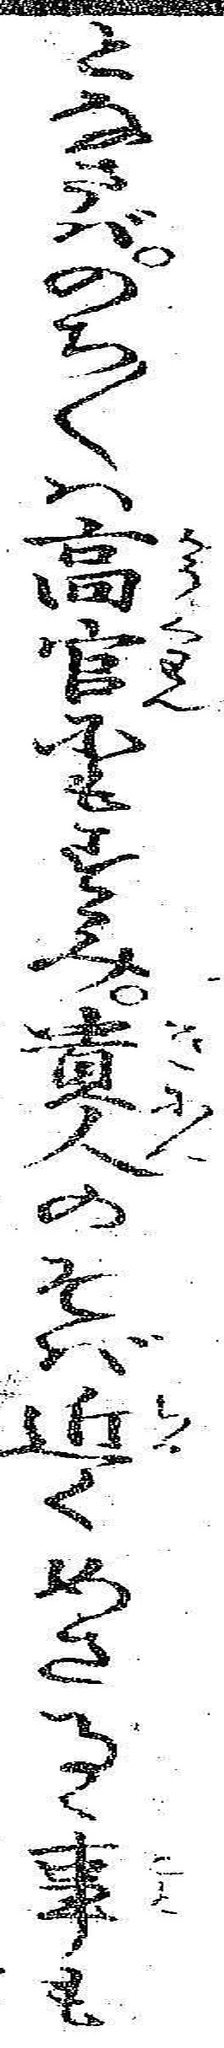となさば。のち〳〵は高官にもすゝみ。貴人のそば近くめさるゝ事も
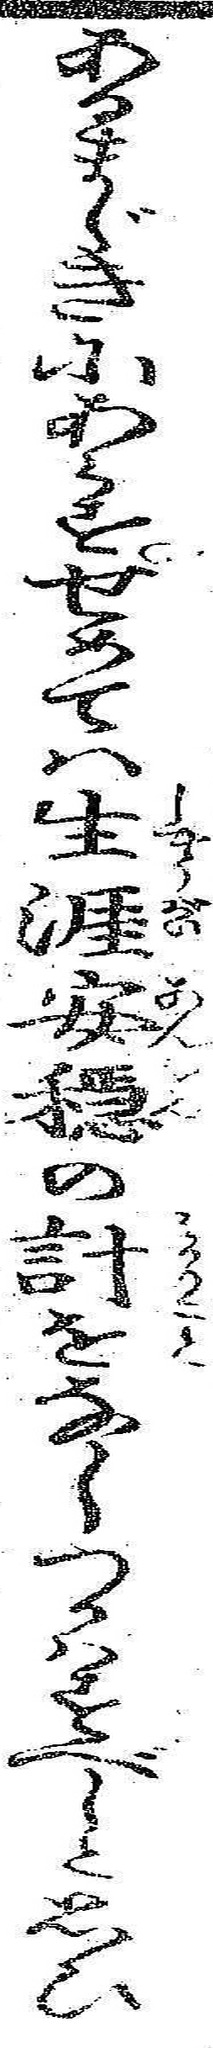あるまじきにあらす。せめては生涯安穏の計をなしつかはすべしと思ひ
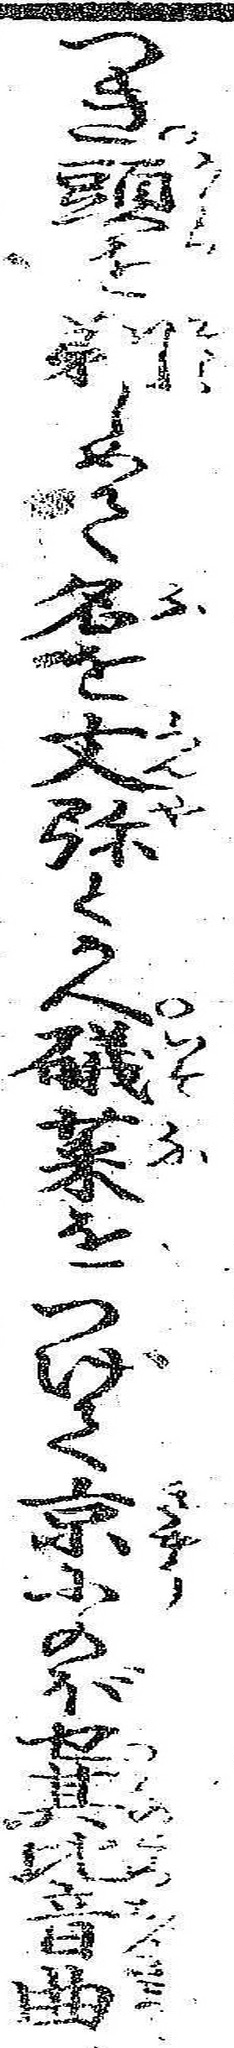つき。頭を剃しめて名を文弥とかへ。磯菜をつけて京にのぼせ。其比音曲
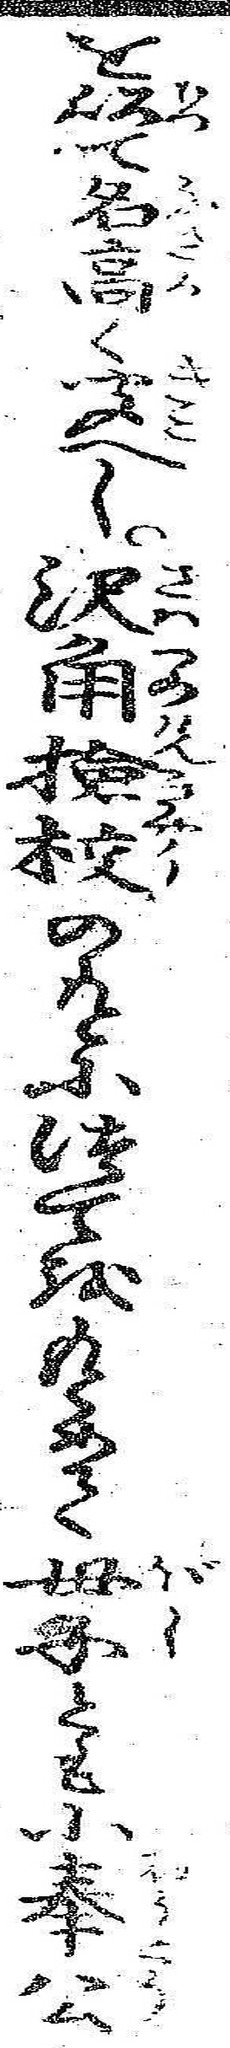を以て名高く聞へし。沢角検校のもとにつてをもとめて母子ともに奉公
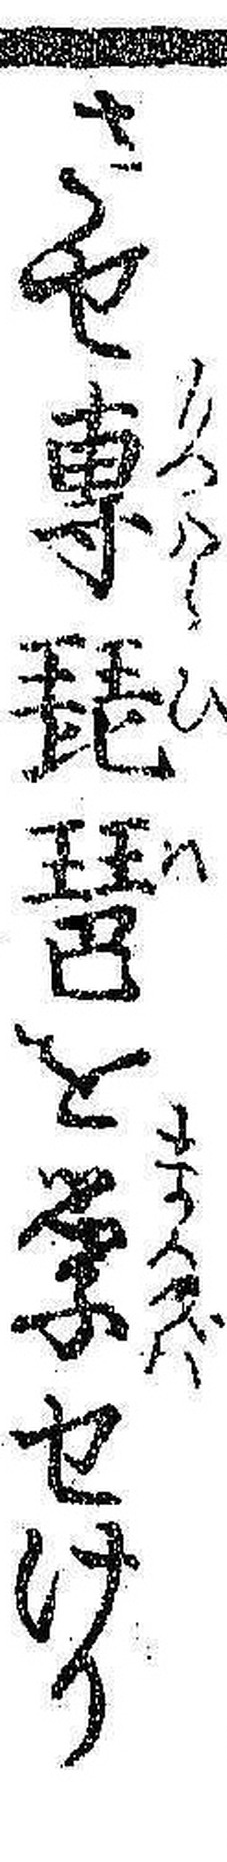させ専琵琶を学せけり
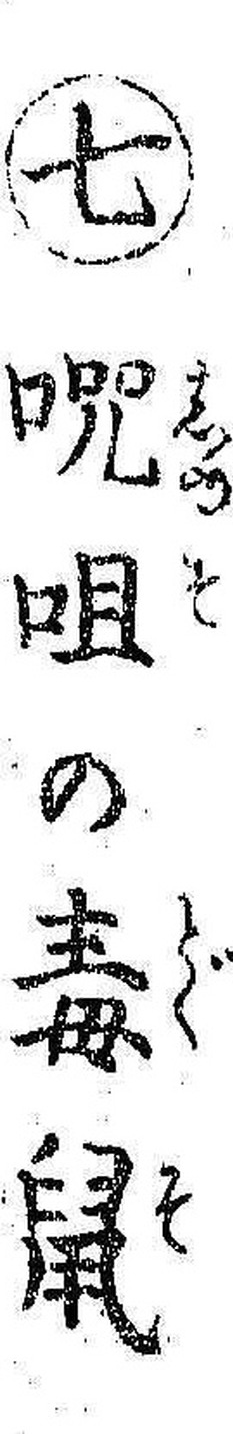七呪咀の毒鼠
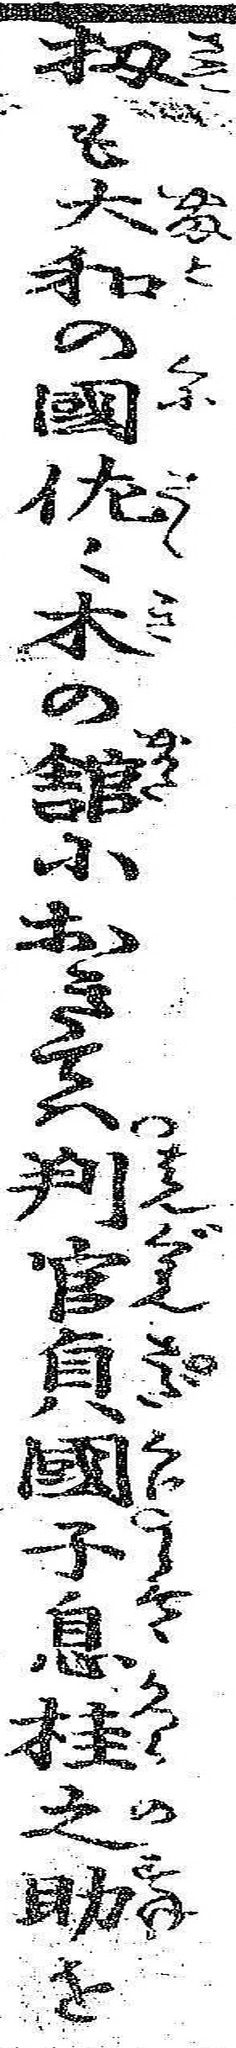扨も大和の国佐々木の館におきては。判官貞国。子息桂之助を
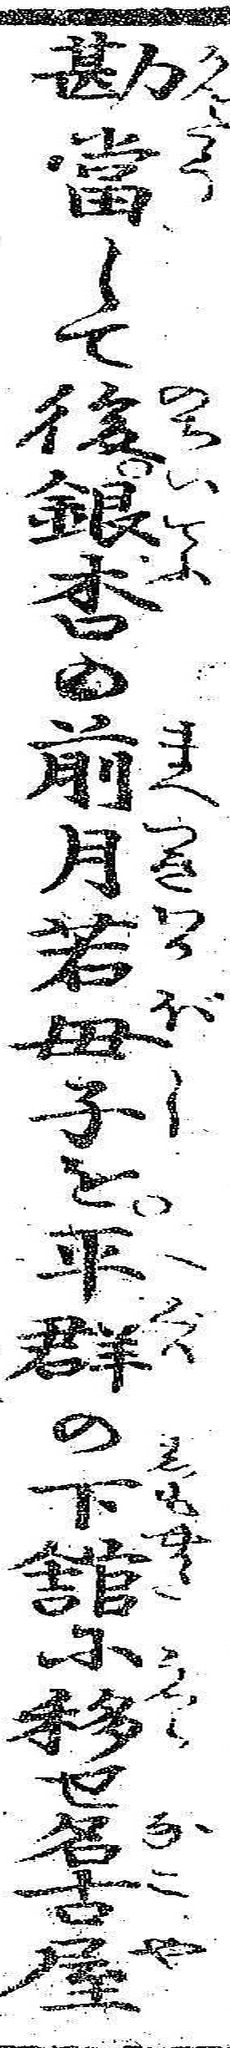勘当して後。銀杏の前月若母子を。平群の下館に移せ名古屋

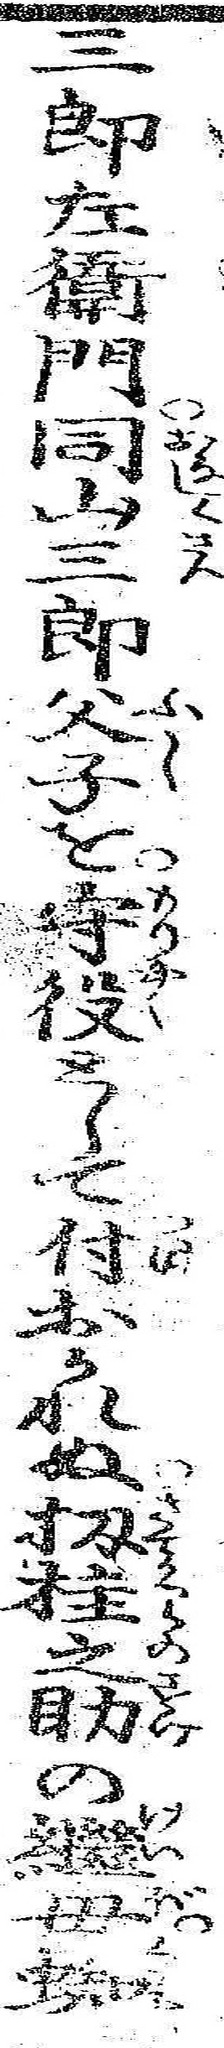三郎左衛門。同山三郎父子を。守役として付おかれぬ。扨桂之助の継母。蜘
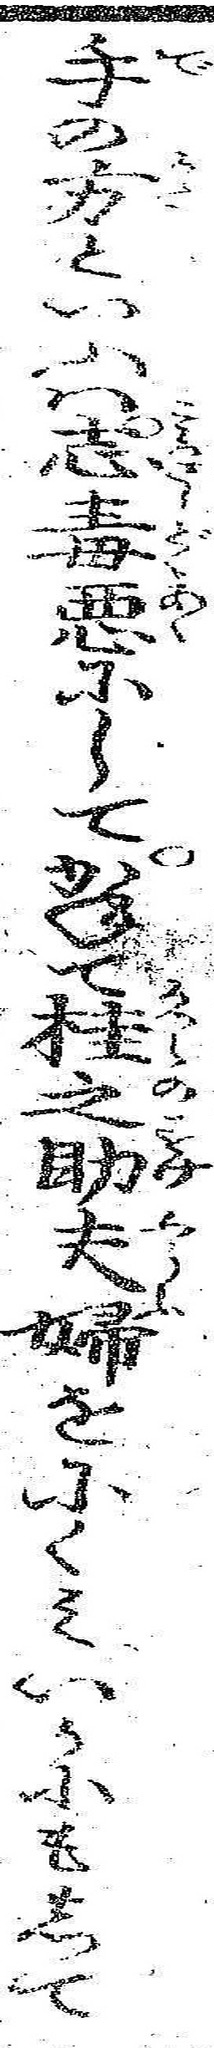手の方といふは。志毒悪にして。かねて桂之助夫婦をにくみいかにもして
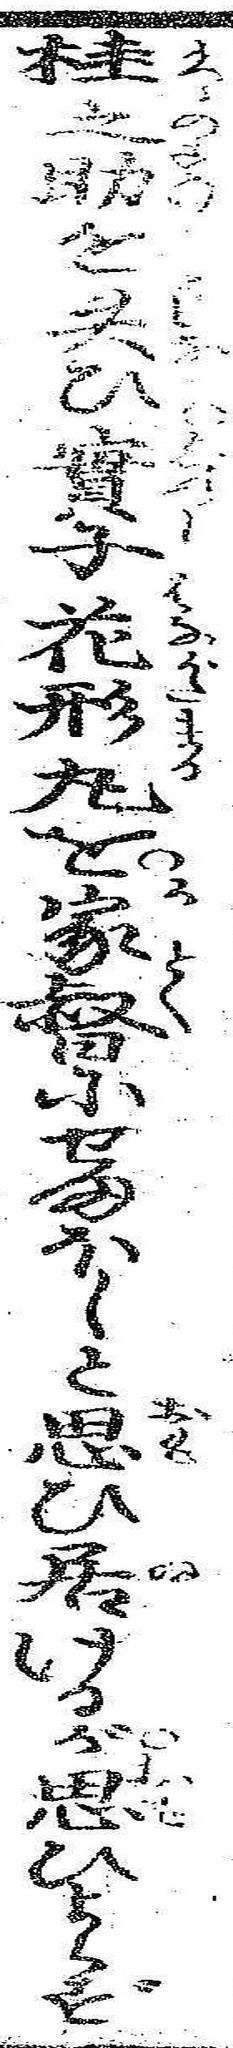桂之助を失ひ。実子花形丸を。家督にせまほしと思ひ居けるが。思ひよらず
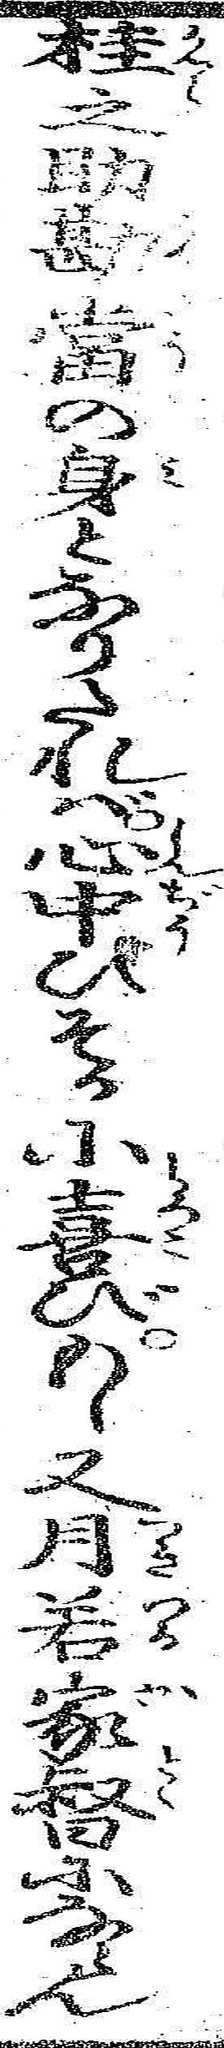桂之助勘当の身となりたれば。心中ひそかに喜び。もし又月若家督にならん
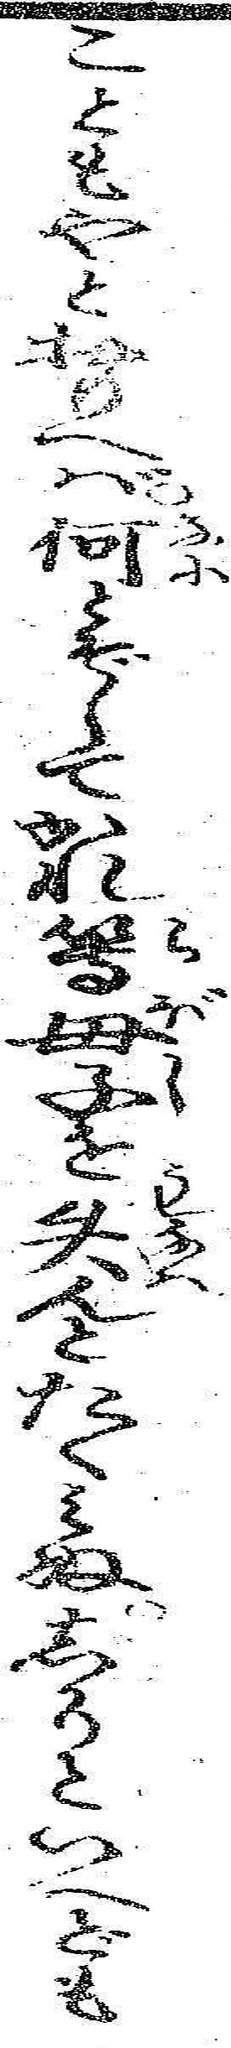こともやとおもへば。何とぞしてかれ等母子を失んとたくみぬ。しかりといへども
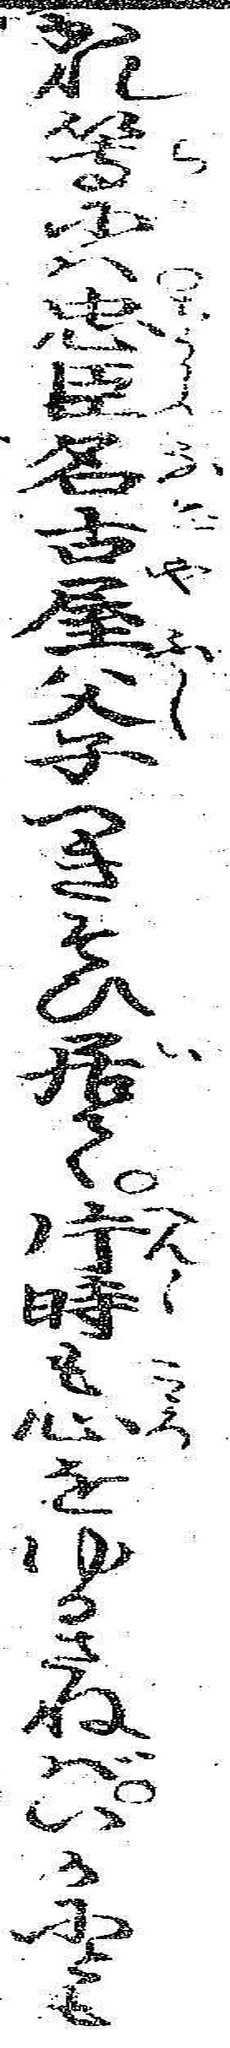かれ等には。忠臣名古屋父子つきそひ居て。片時も心をゆるさねば。いかにとも
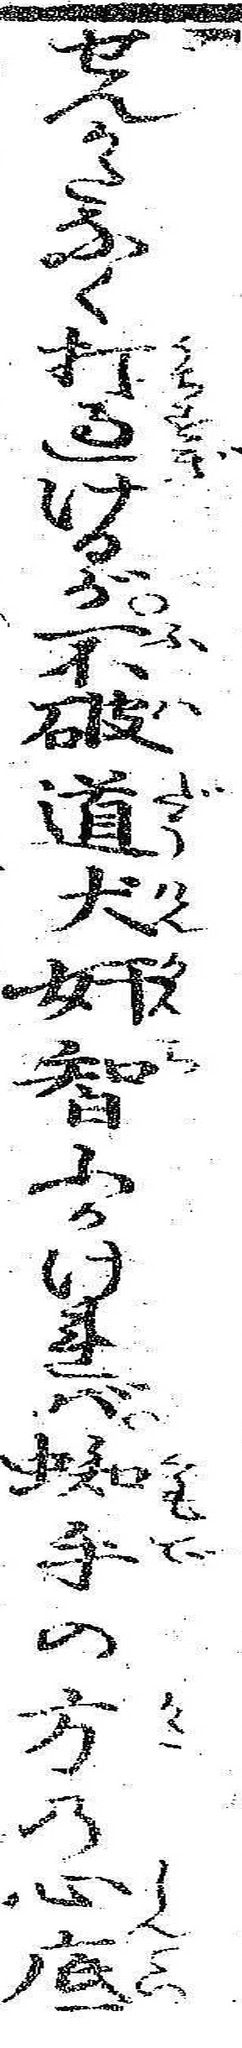せんかたなく打過けるが。不破道犬奸智ふかければ。蜘手の方の心底
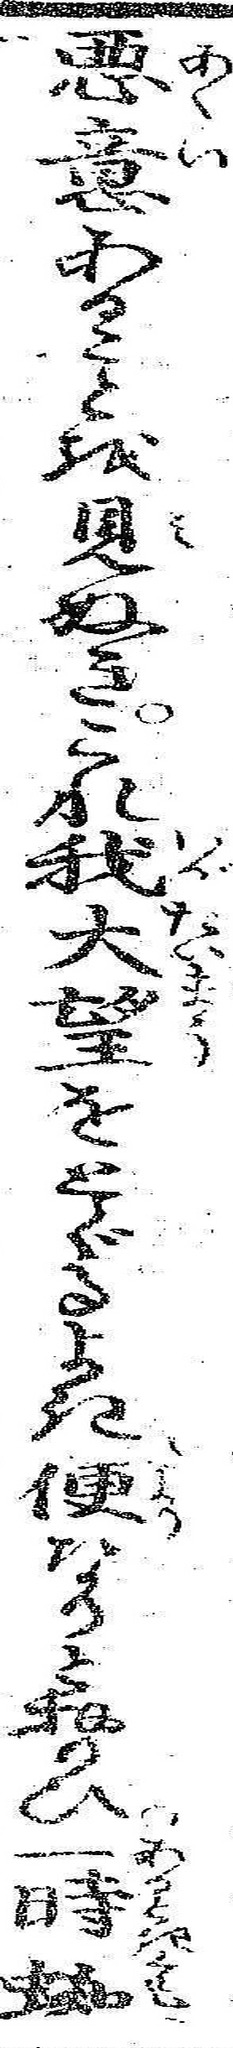悪意あることを見ぬき。これ我大望をとぐるよき便なりとおもひ。一時蜘
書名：昔話稲妻表紙
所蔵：国文学研究資料館
